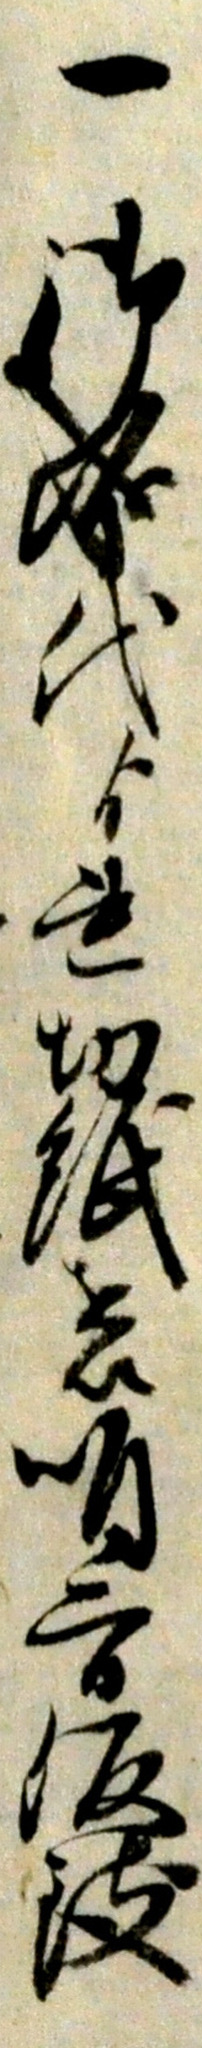一御城代ゟ此切紙を以明二日仮致
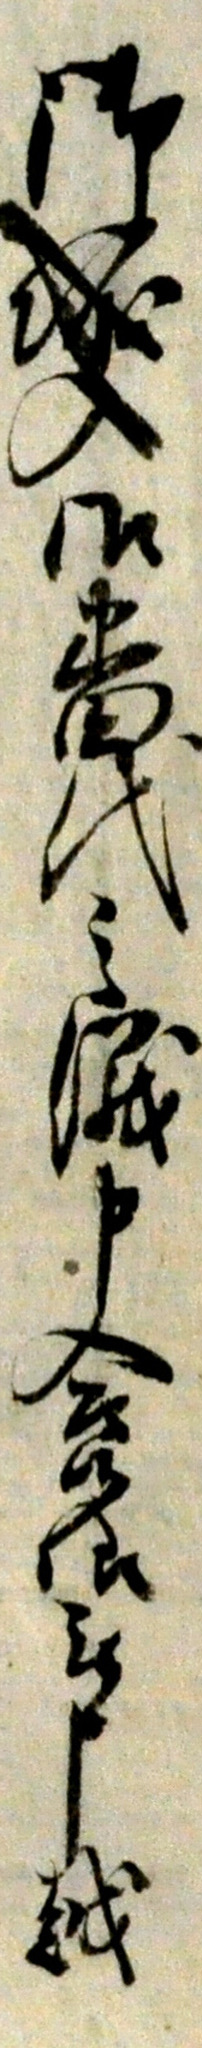御城入御番代之儀申合候様被申越
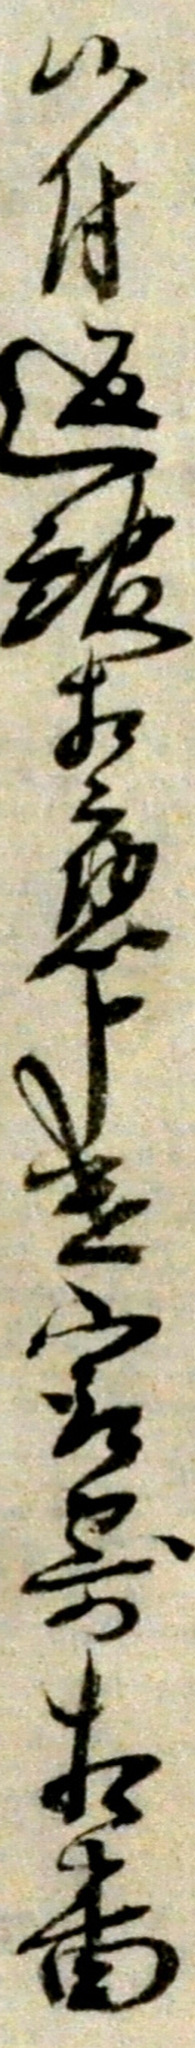候付返報相応申遣最寄相番
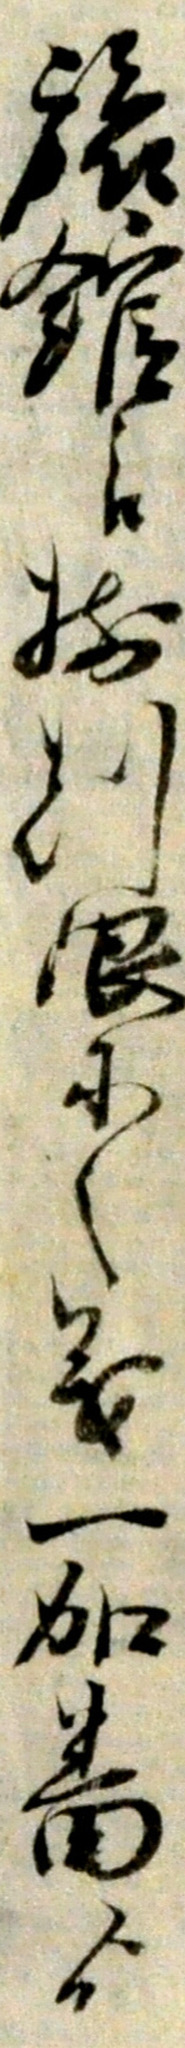旅館江揃刻限等之義一加番ゟ
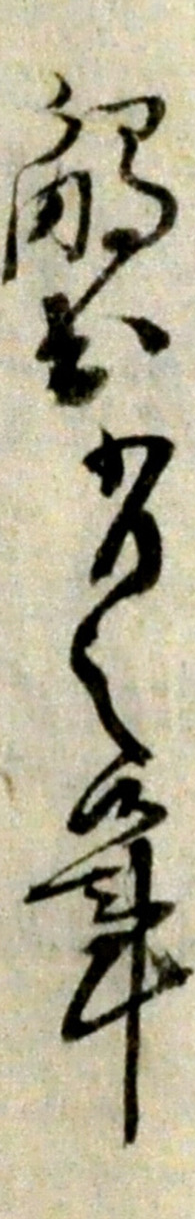触出有之候事
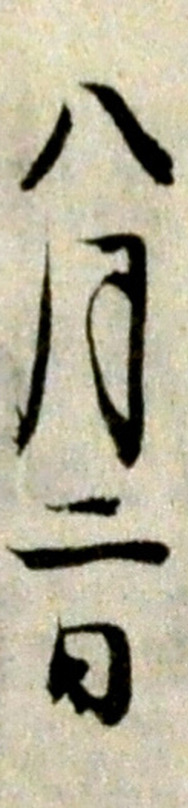八月二日
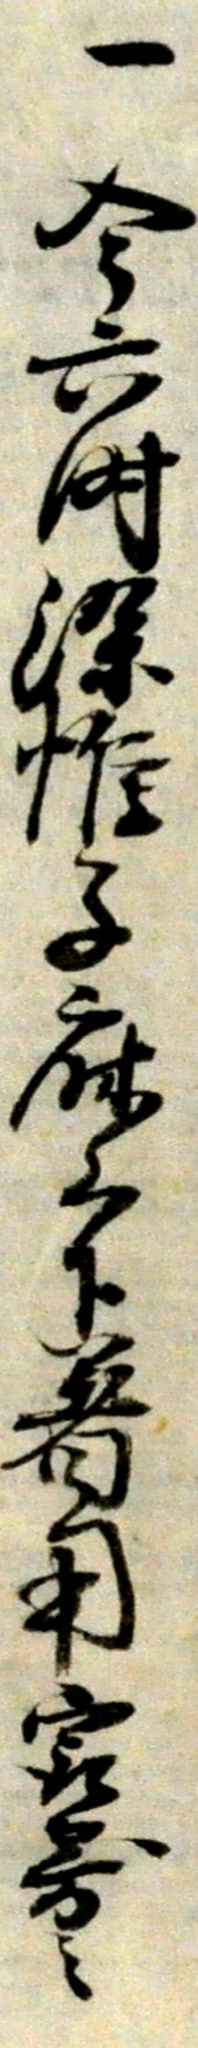一今六時染帷子麻上下着用最寄之
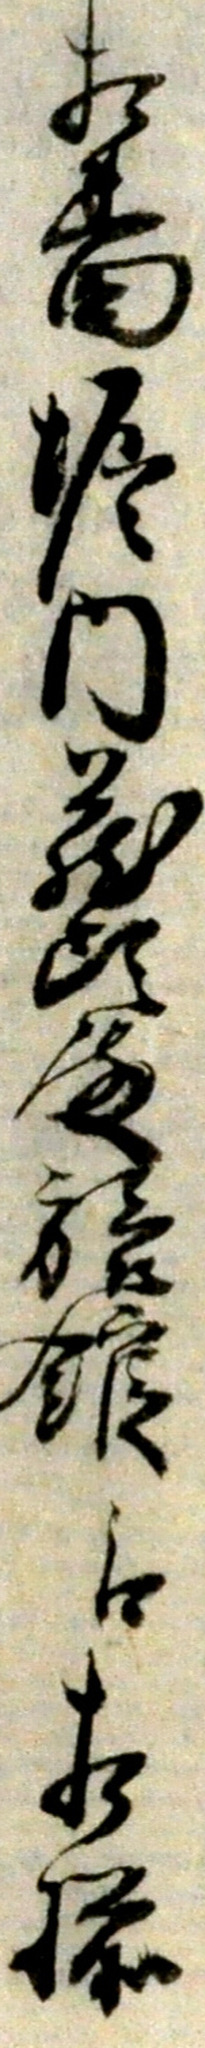相番堀内藏頭旅館江相揃
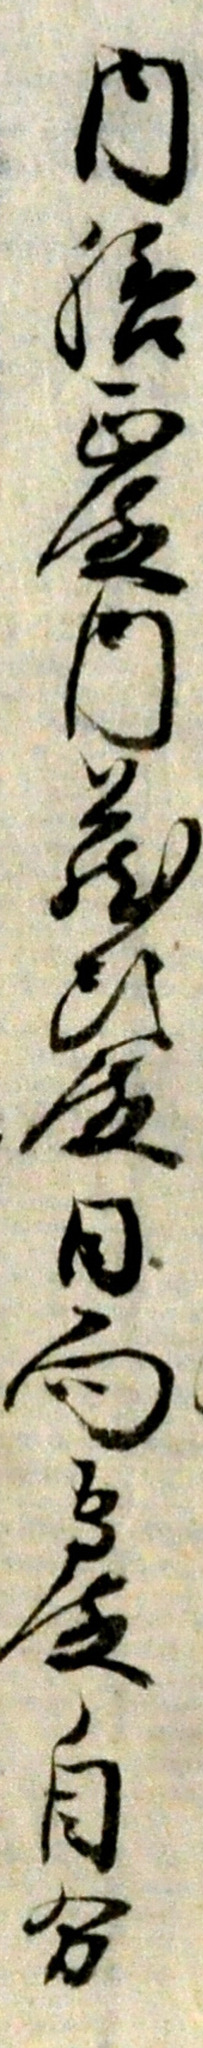内膳正殿内蔵頭殿日向守殿自分
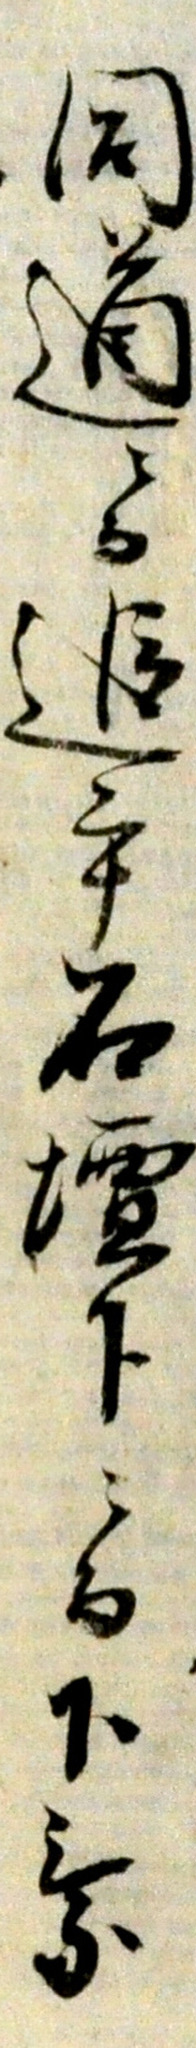同道二而追手石壇下二而下乗
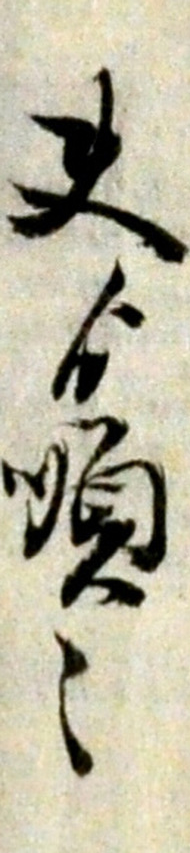夫ゟ順々
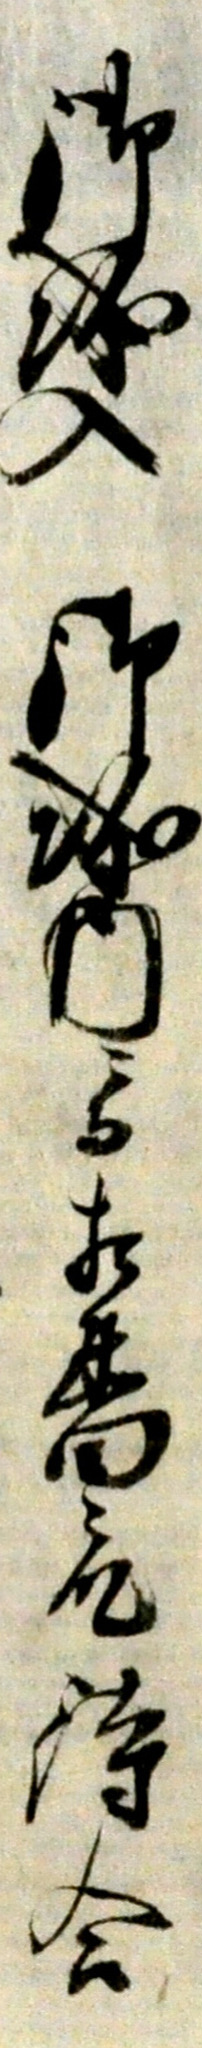御城入御城門二而相番衆待合
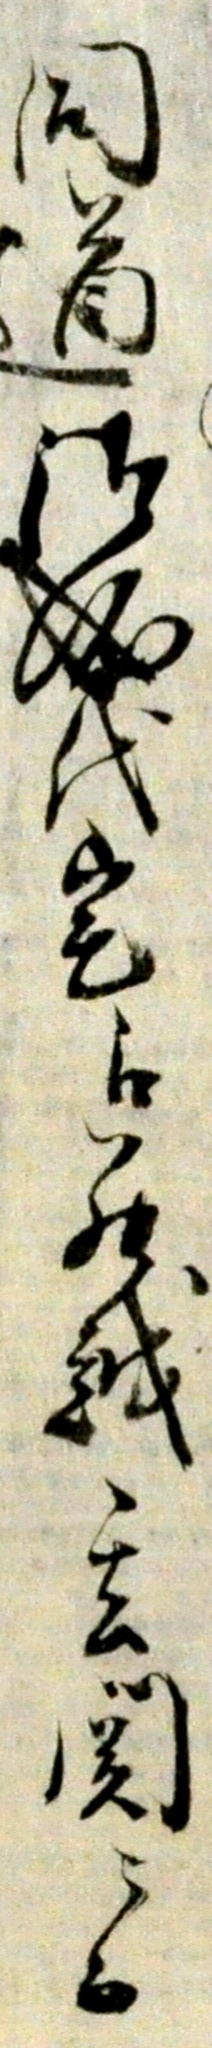同道御城代宅江罷り越玄関ニ而
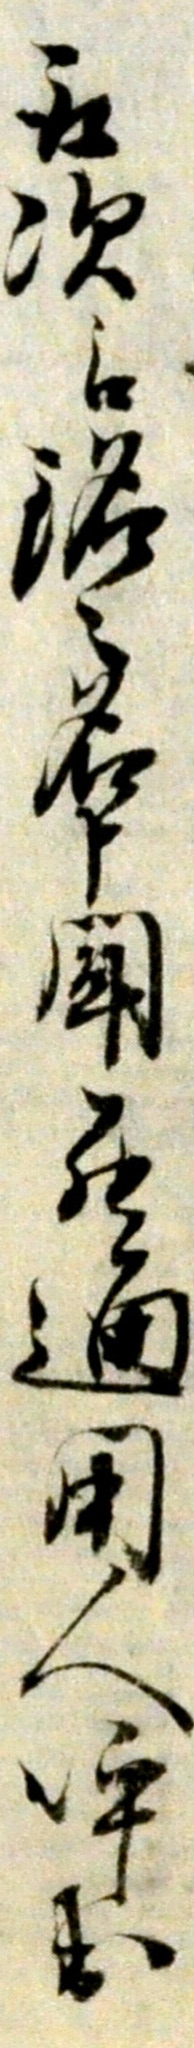取次江銘々名申聞罷通用人呼出
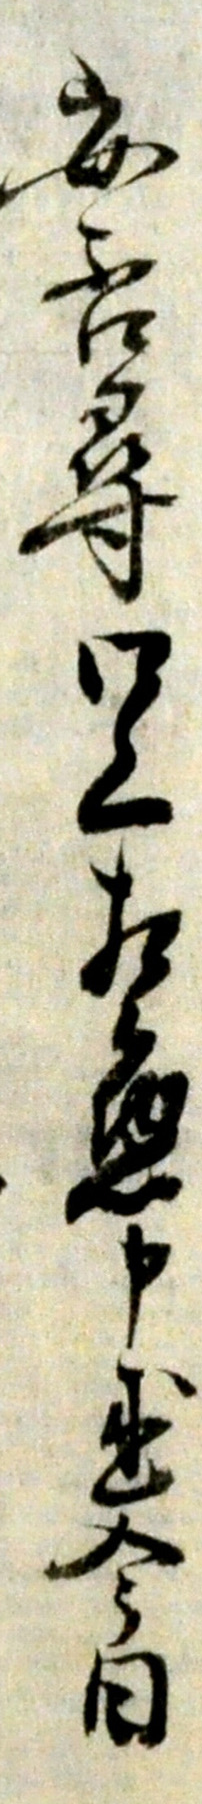安否尋口上相応申出今日
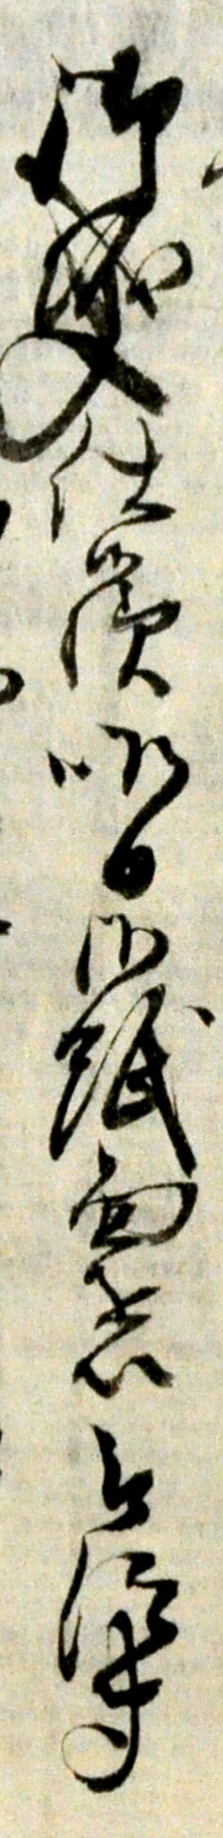御城入仕候様昨日御紙面を以被仰聞
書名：大阪加番関係諸書留〔一括〕
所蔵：伊那市立高遠町図書館・合同会社AMANE
